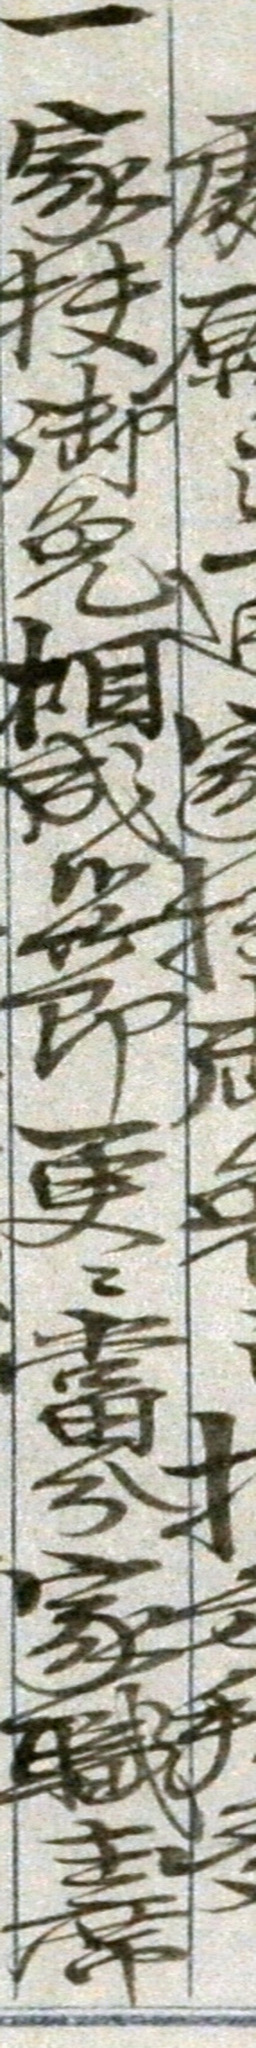一家扶御免相成候節更ニ当分家職主席
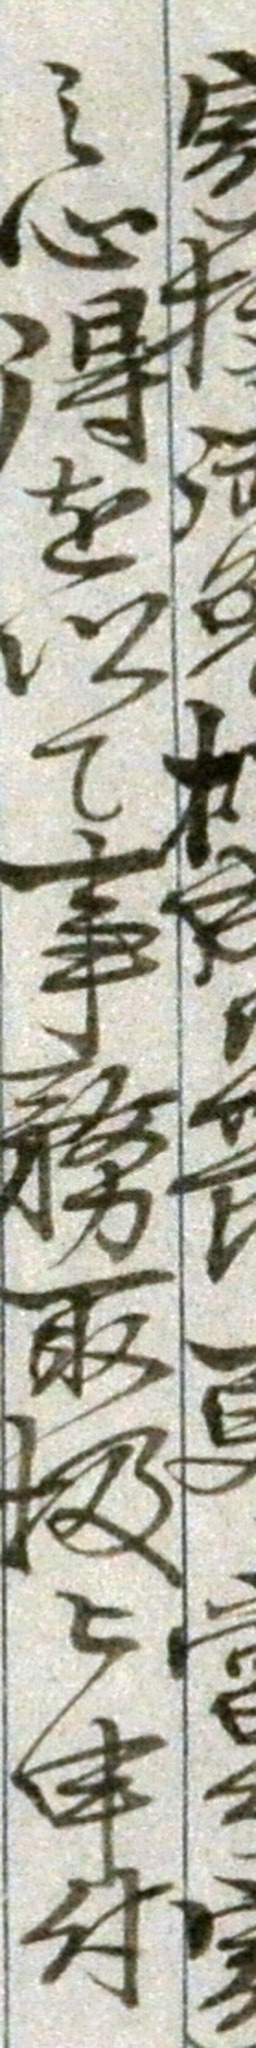之心得を以て事務取扱被申付
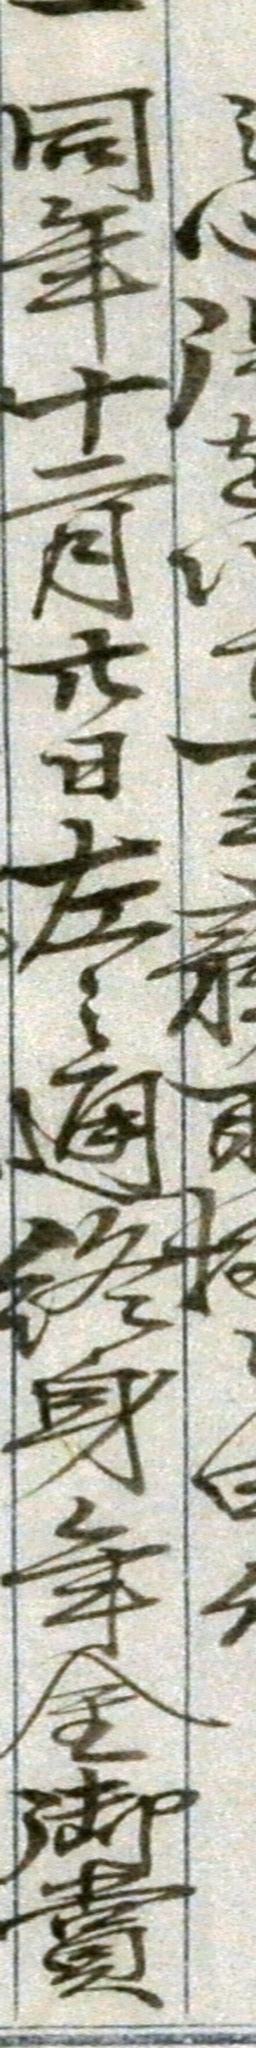一同年十二月廿日左之通終身年金御賞
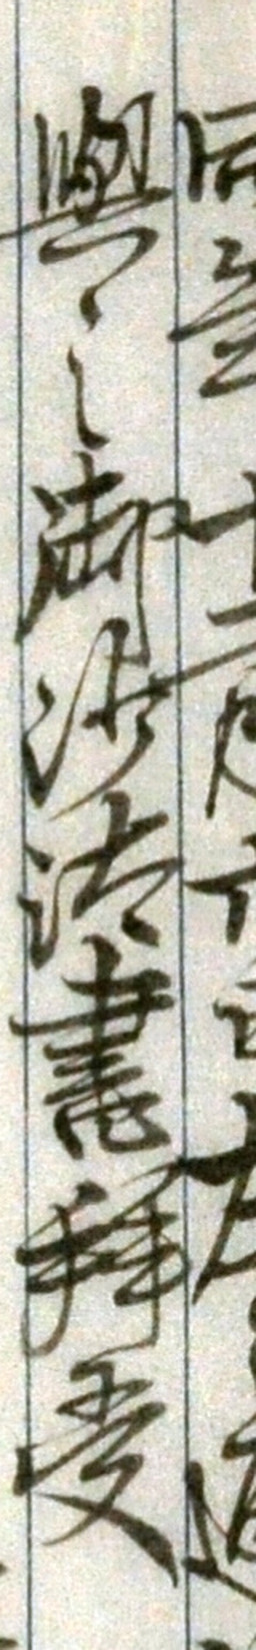与之御沙汰書拝受
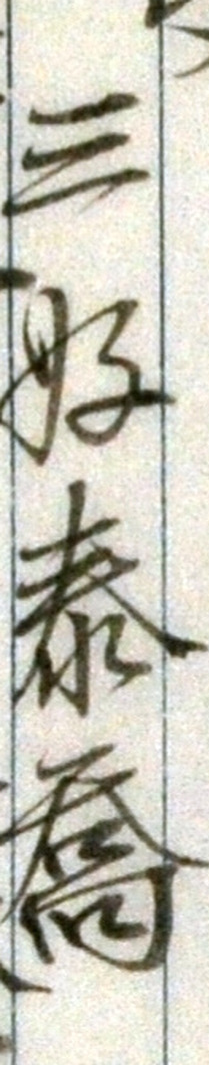三好泰喬
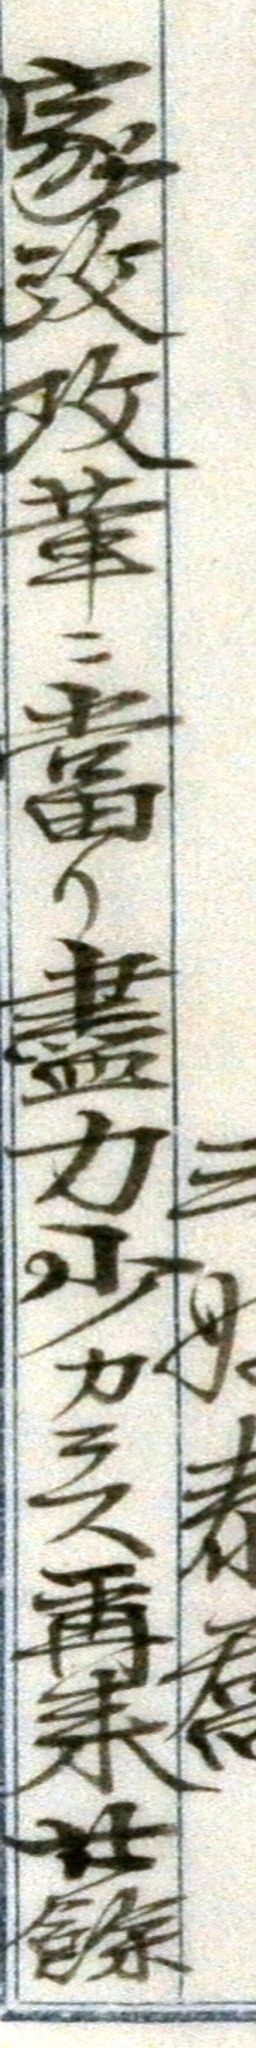家政改革ニ当り尽力少カラス再来廿余
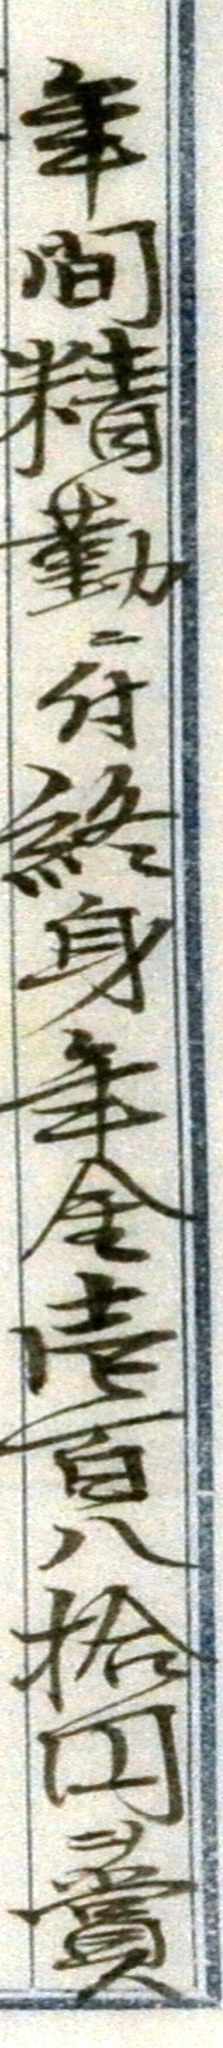年間精勤ニ付終身年金壱百八拾円ヲ賞
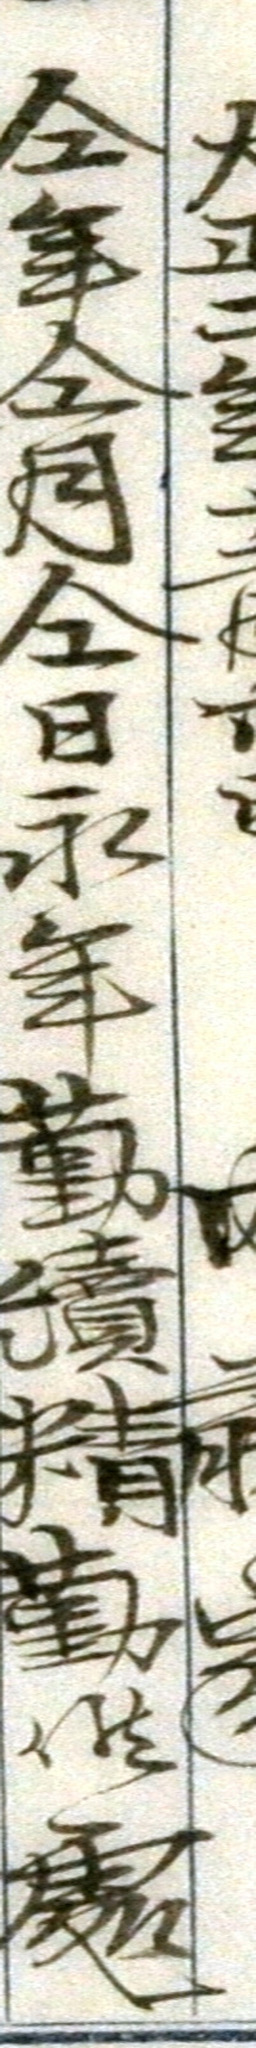一同年同月同日永年勤続精勤候処
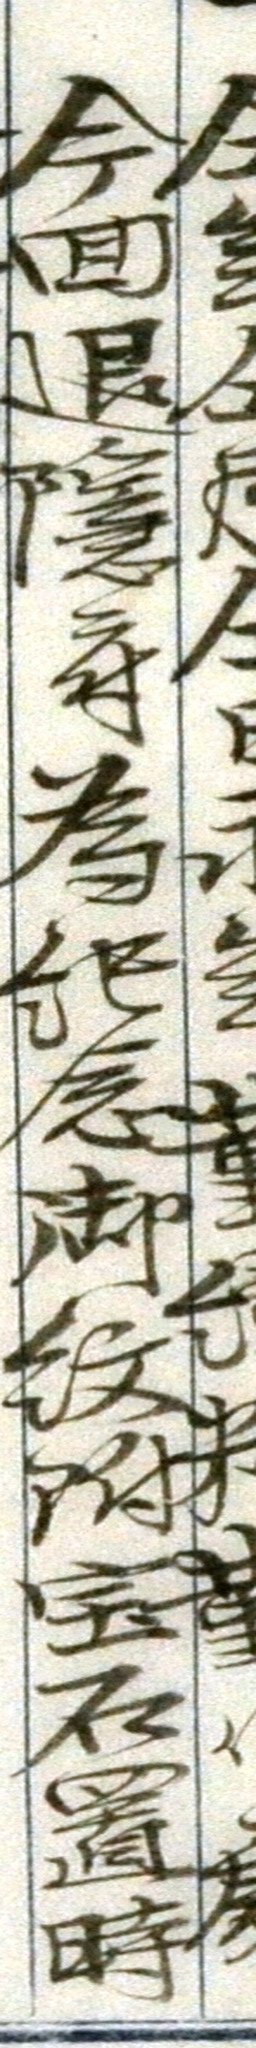今回退隠ニ付為記念御紋付宝石置時
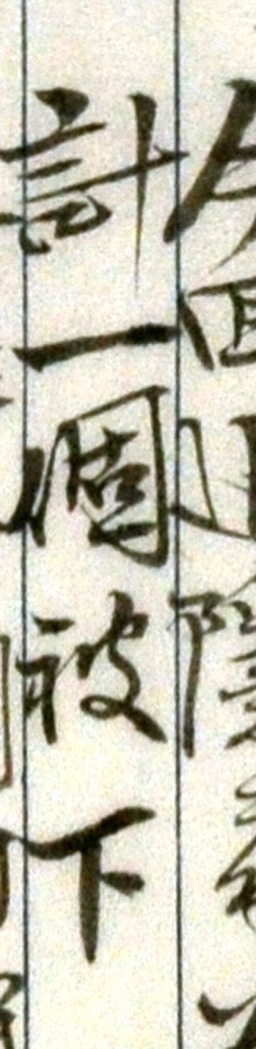計一個被下
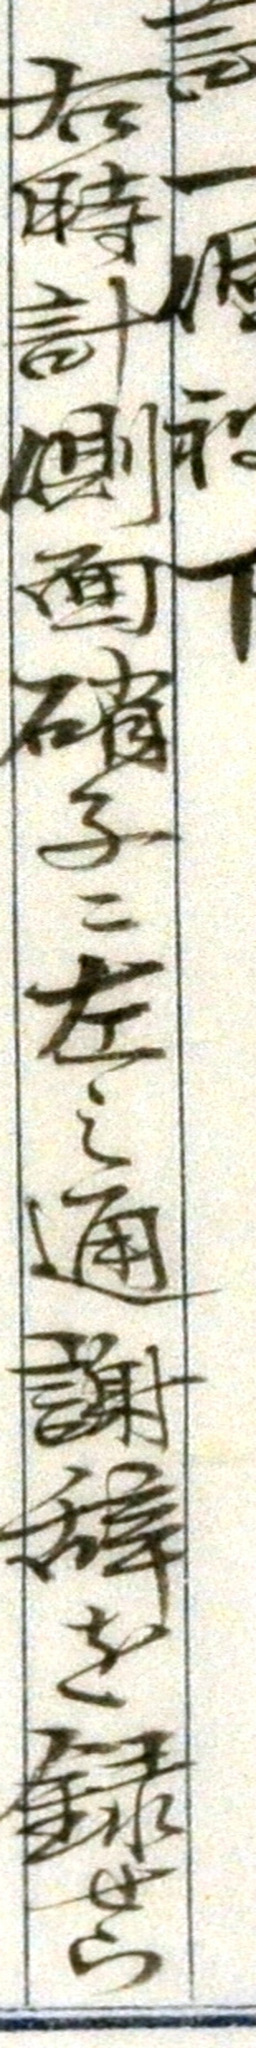右時計側面硝子ニ左之通謝辞を録せら
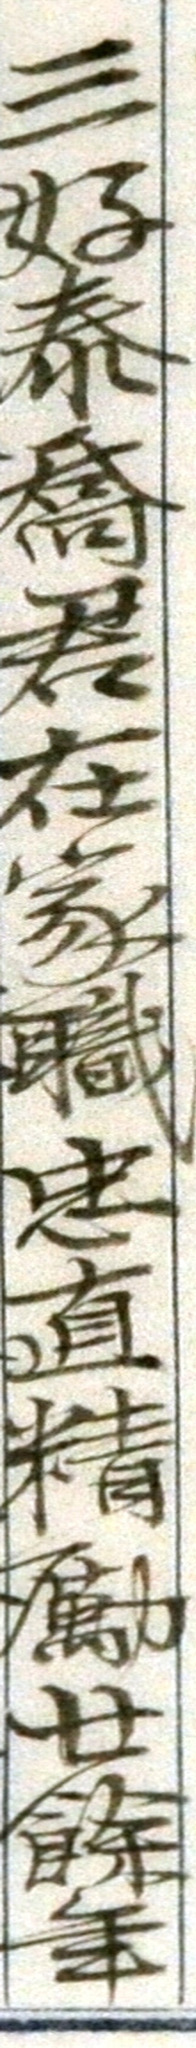三好泰喬君在家職忠直精励廿余年
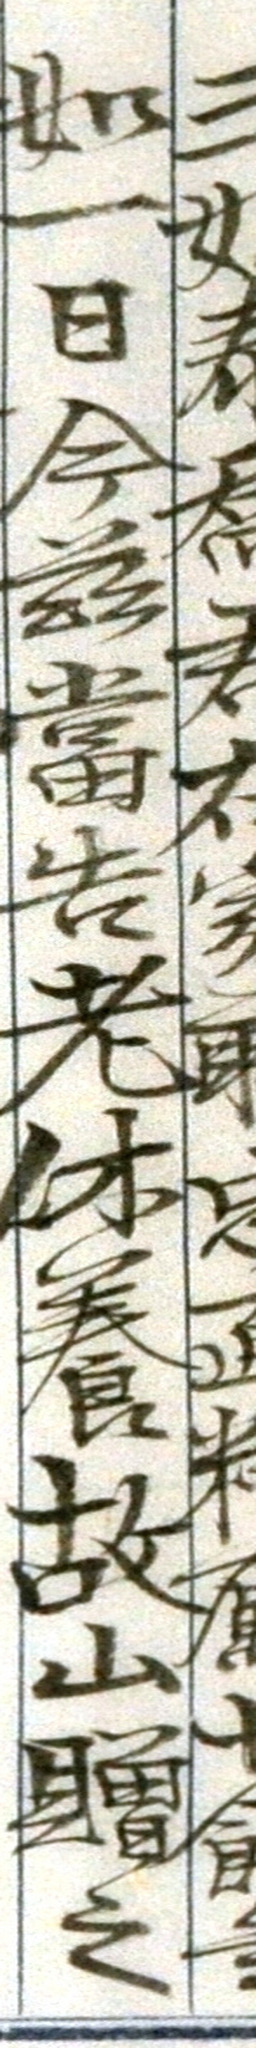如一日今茲当告老体養故山贈之
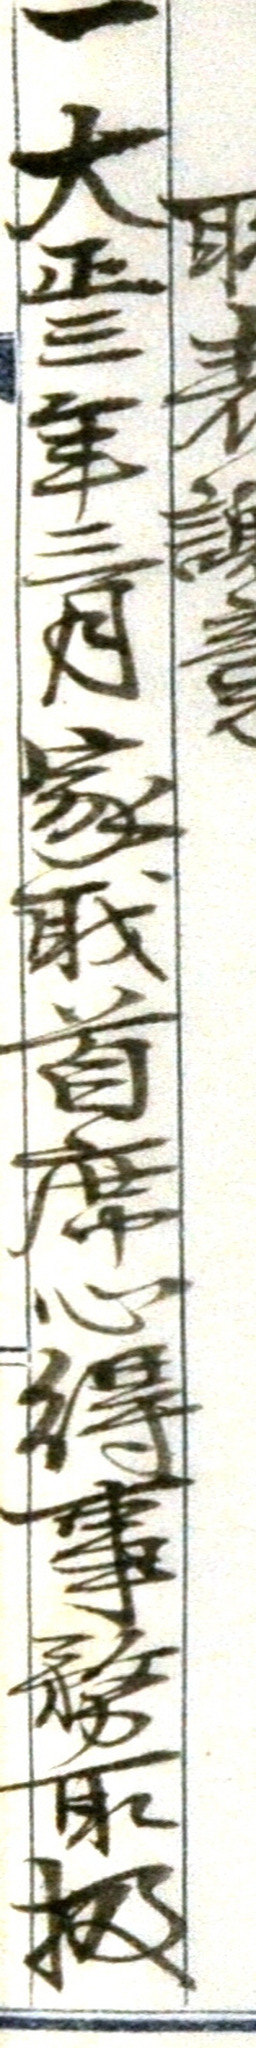一大正三年三月家織首席心得事務取扱

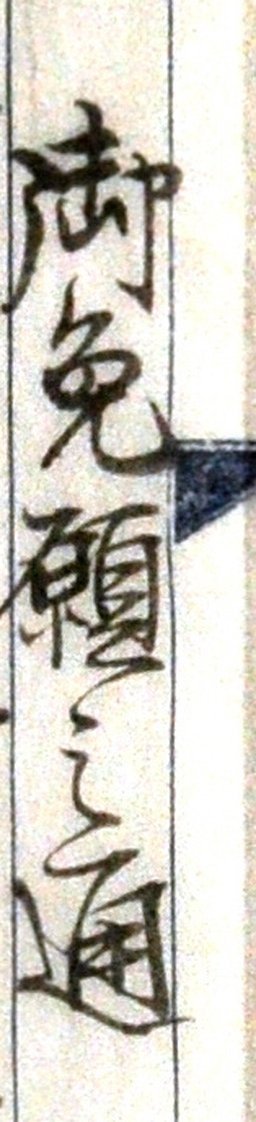御免願之通
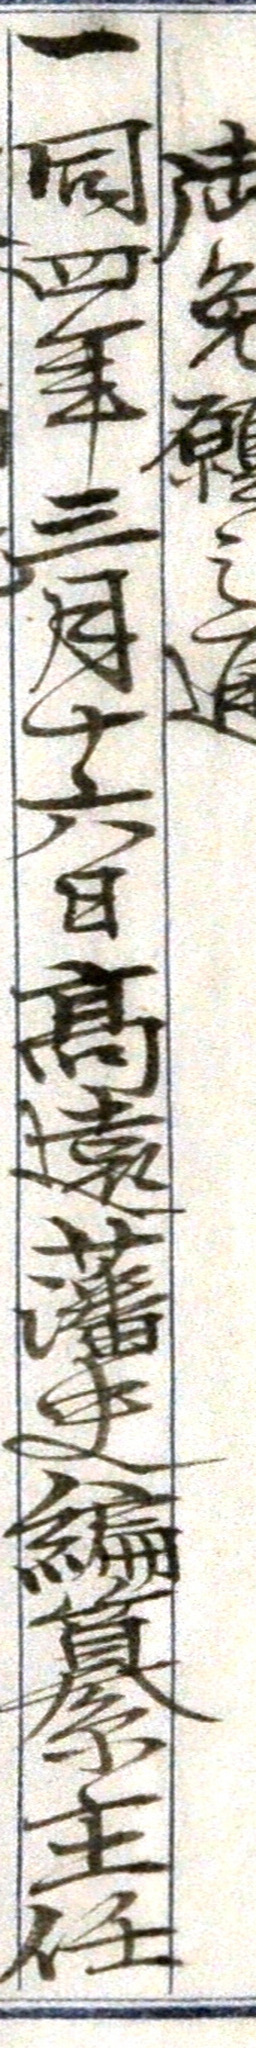一同四年三月十六日高遠藩史編纂主任
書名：三好氏先代以来勤仕録、池田丈介一家勤仕録
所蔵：伊那市立高遠町図書館・合同会社AMANE
